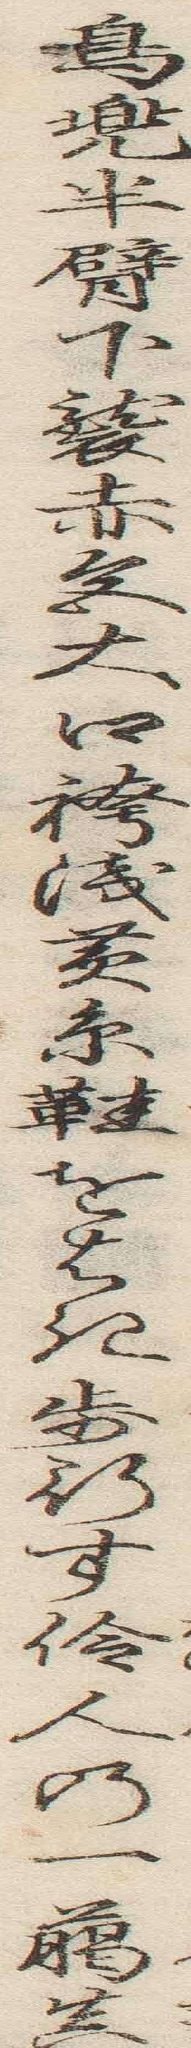鳥兠半臂下襲赤色大口袴浅黄糸鞋をはき歩行す伶人の一﨟眞
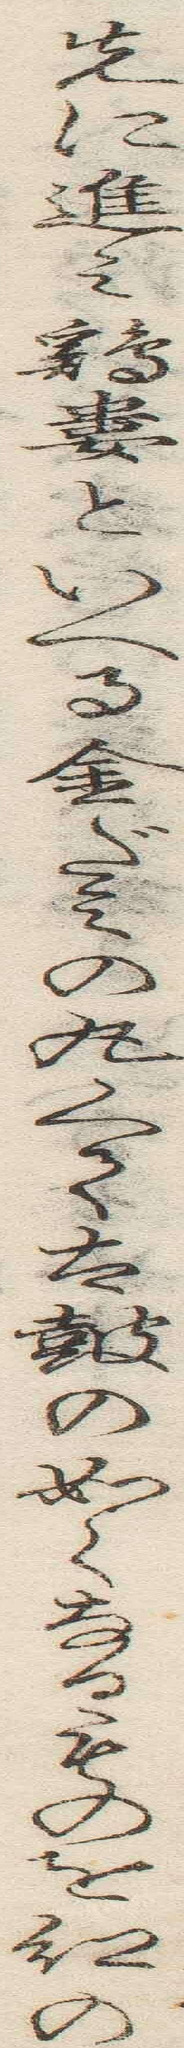先に進み鷄婁といへる金だみの丸くて太皷の如くなるものを紅の
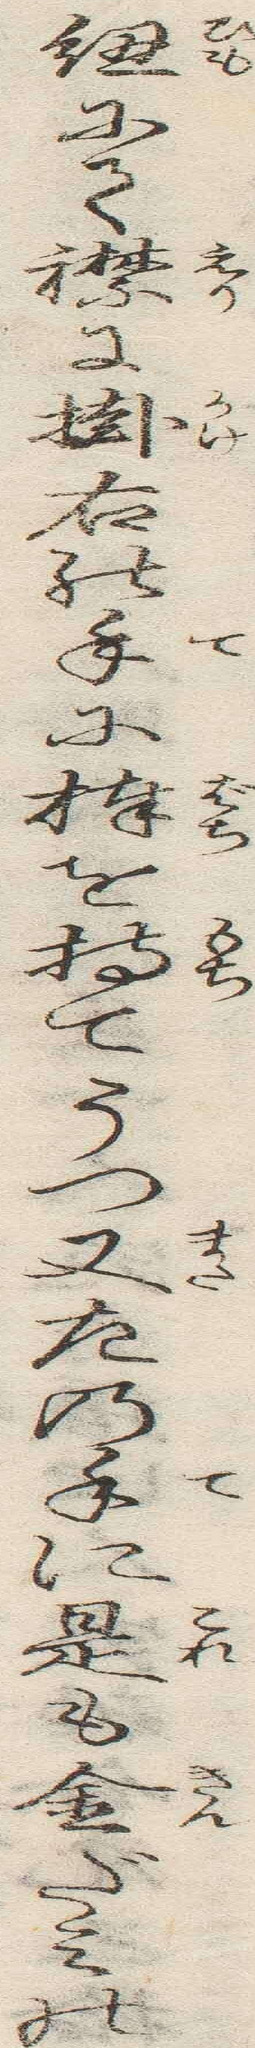紐にて襟に掛右の手に棒を持てうつ又左の手に是も金だみの
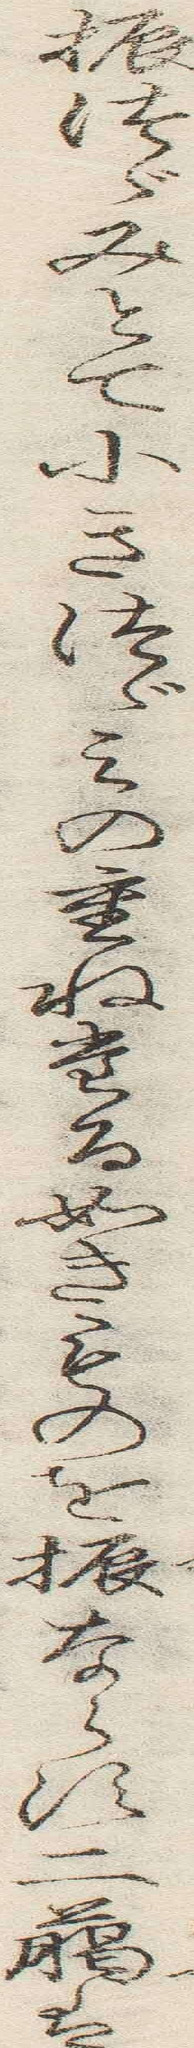振つゞみとて小きつゞみに重ねたる如きものを振ならす二﨟は
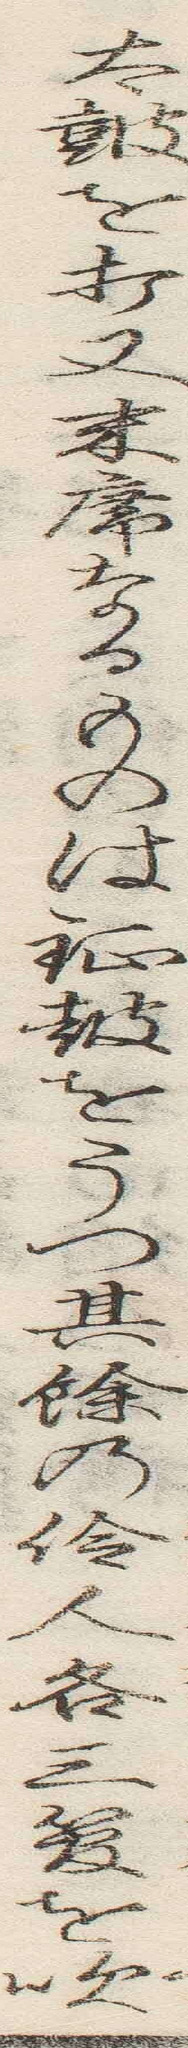太皷を打又末席なるものは鉦皷をうつ其餘の伶人各三管を吹
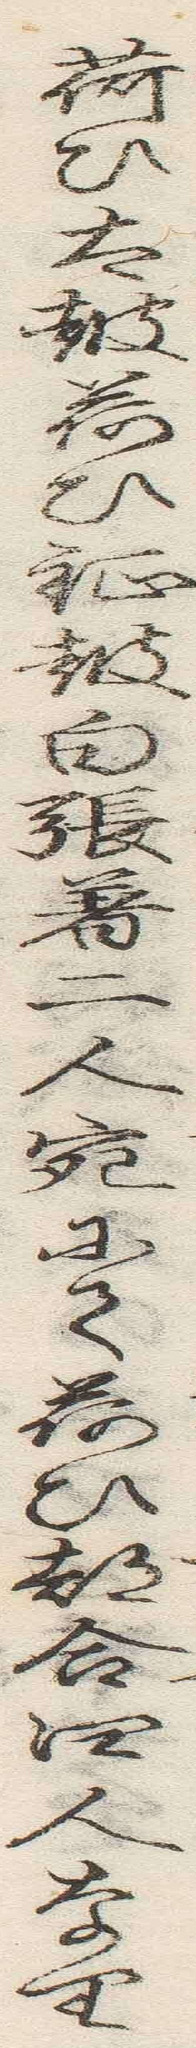荷ひ太皷荷ひ鉦皷白張着二人宛にて荷ひ都合四人なり
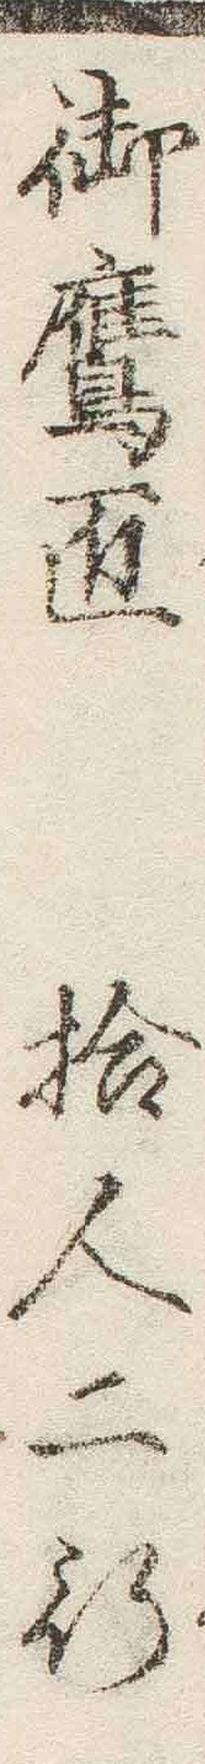御鷹匠拾人二行
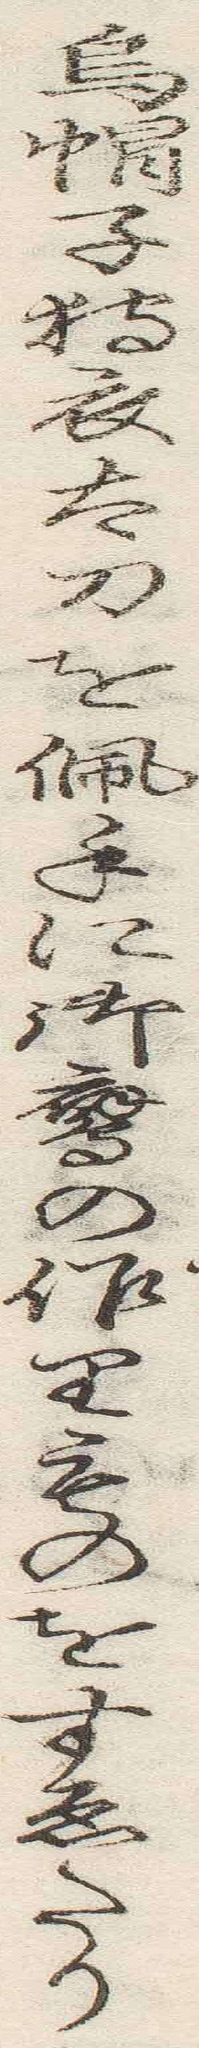烏帽子狩衣太刀を佩手に御鷹の作りものをすゑたり
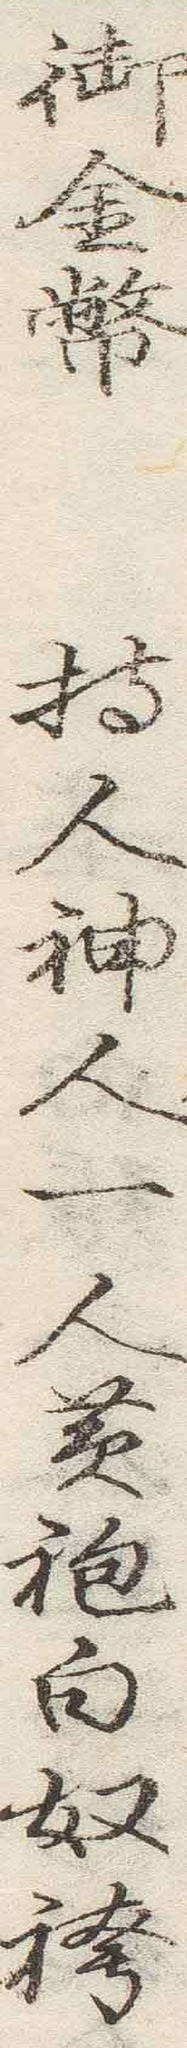御金幣持人神人一人黄袍白奴袴
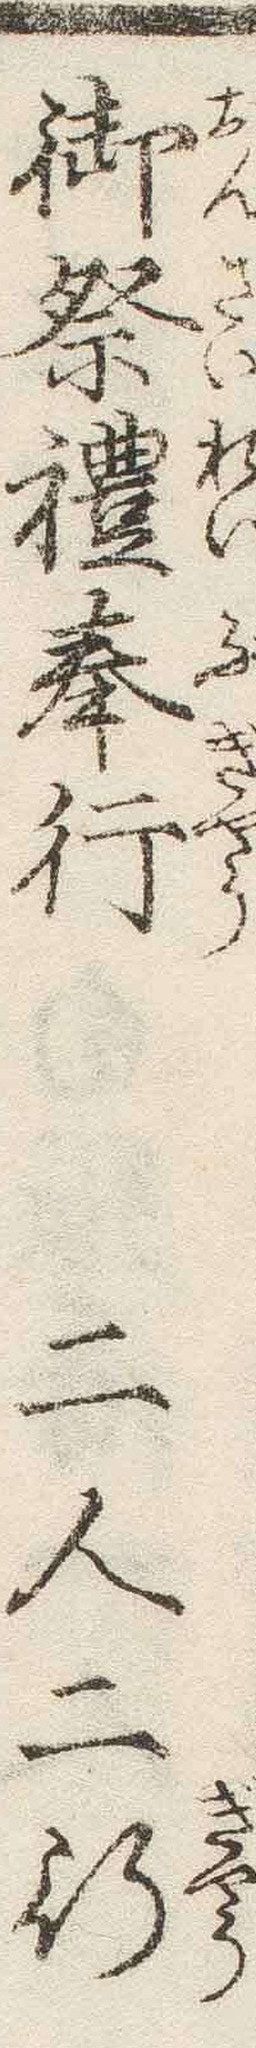御祭禮奉行二人二行
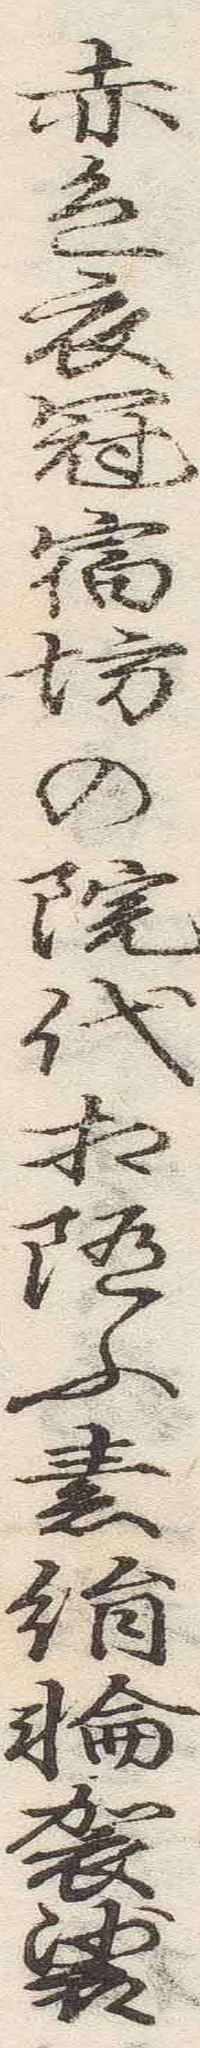赤色衣冠宿坊の院代相随ふ素絹輪袈裟
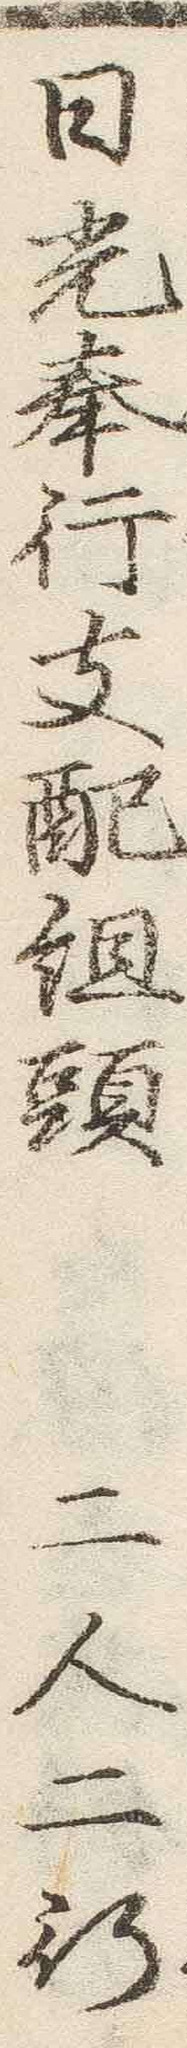日光奉行支配組頭二人二行
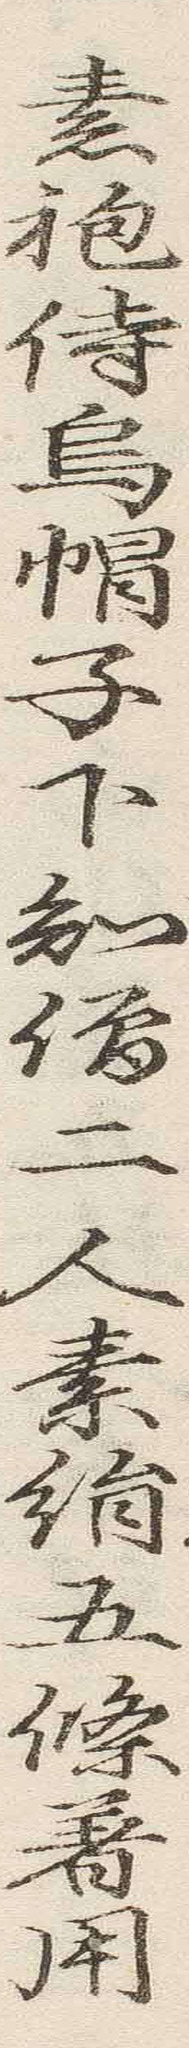素袍侍烏帽子下知僧二人素絹五條着用
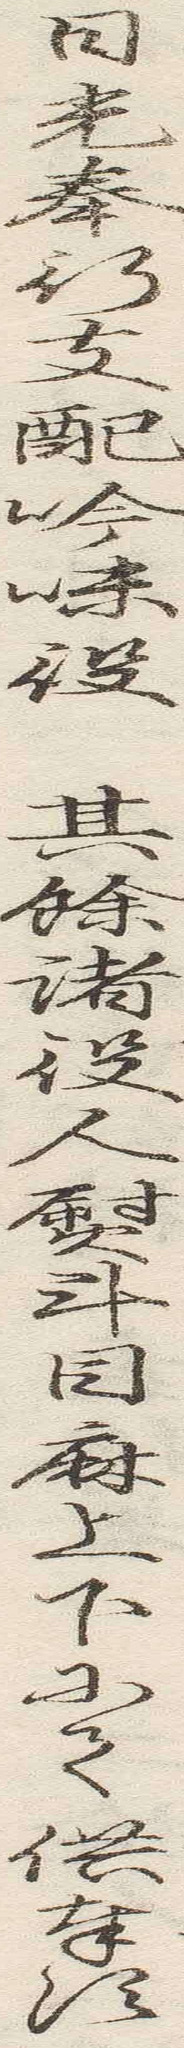日光奉行支配吟味役其餘諸役人熨斗目麻上下にて供奉す
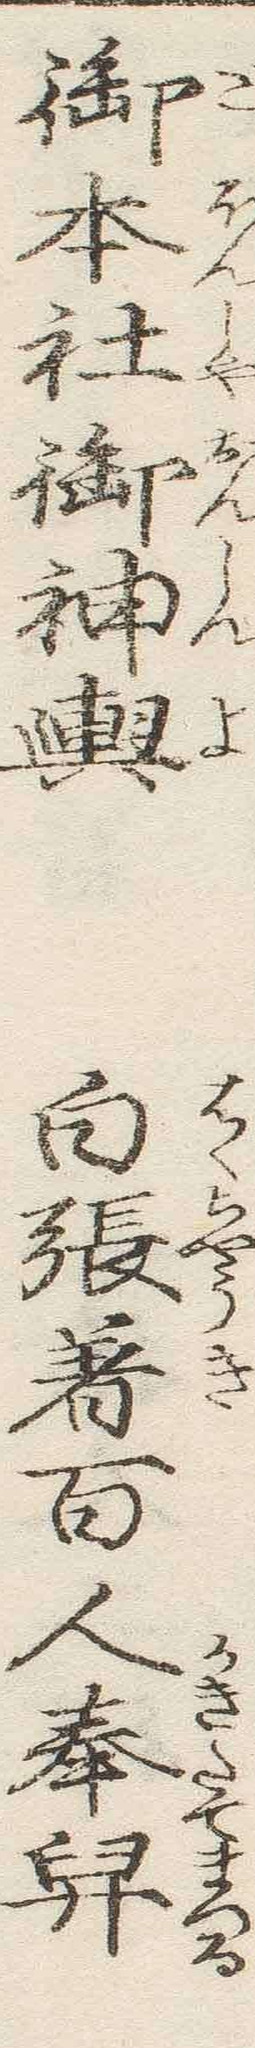御本社御神輿白張着百人奉舁
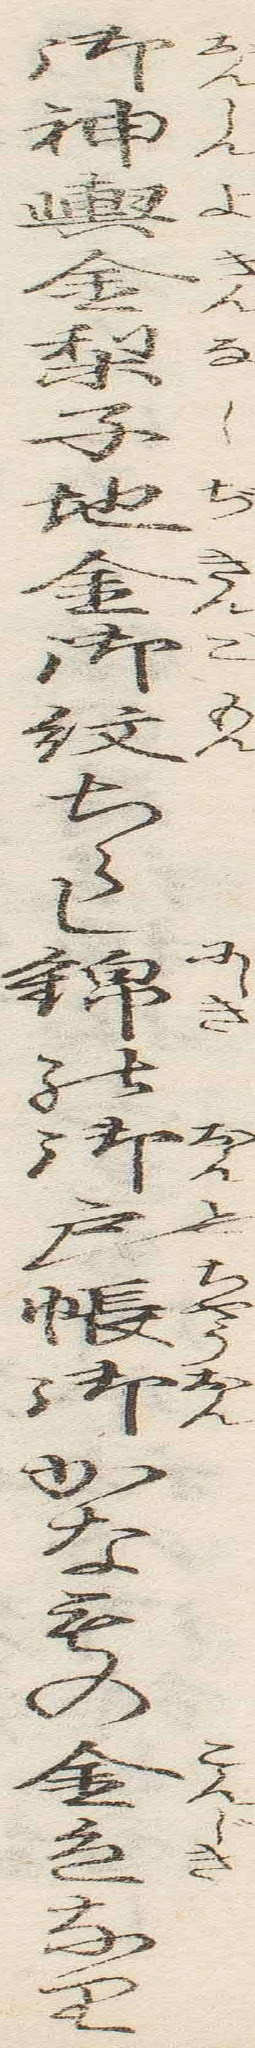御神輿金梨子地金御紋ちらし錦の御戸帳御かなもの金色なり
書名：日光山志
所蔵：東京学芸大学附属図書館 国文学研究資料館
